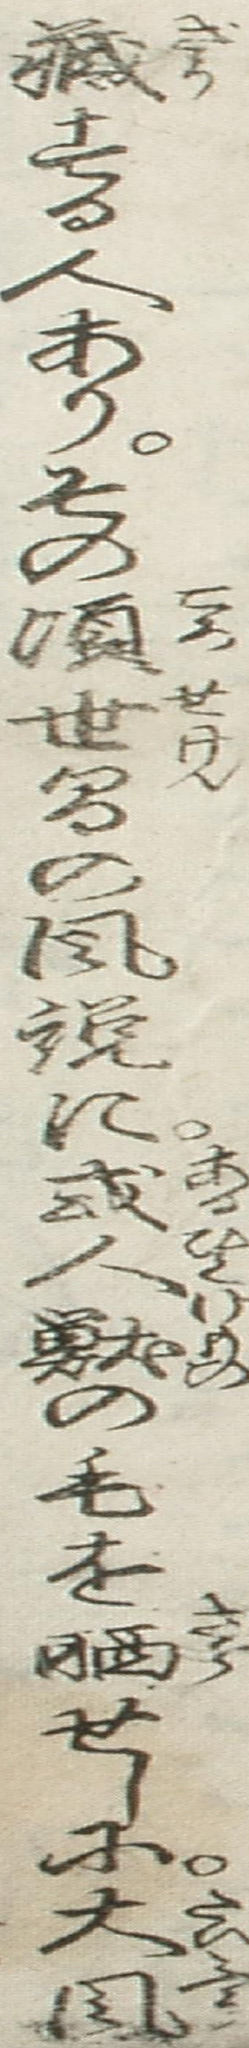蔵する人あり。その頃世間の風説に。或人獣の毛を晒せしに。大風
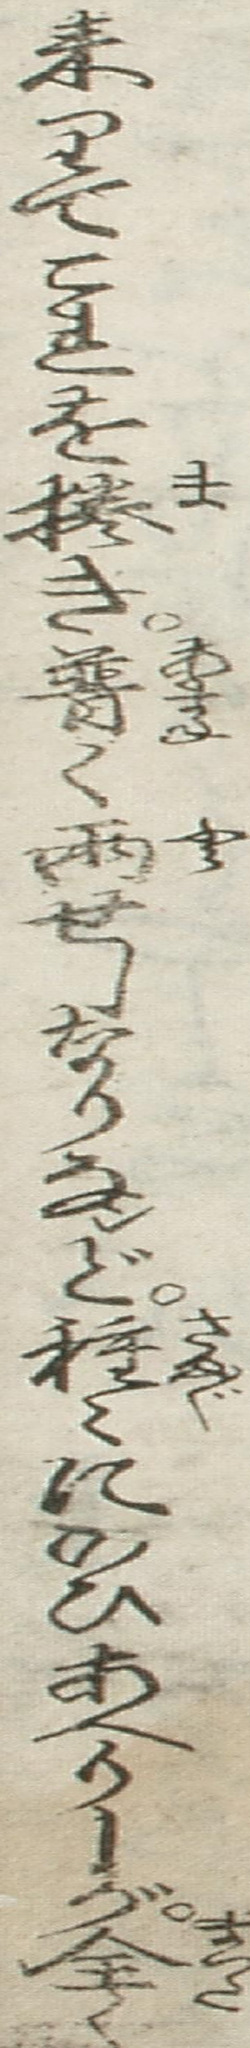来りてこれを捲き。普く雨せしなンど。種々にいひあへりしが。全く

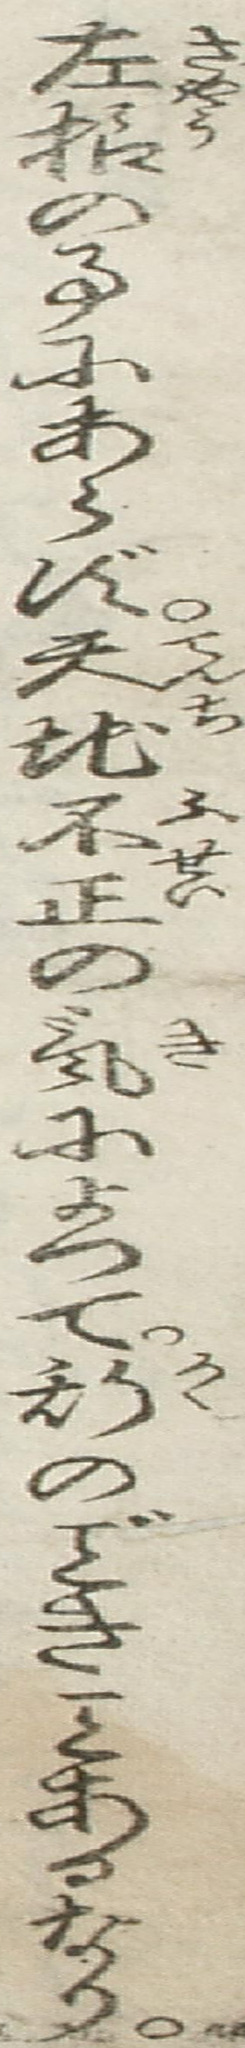左様の事にあらず。天地不正の気によつて斯のごときことあるなり。
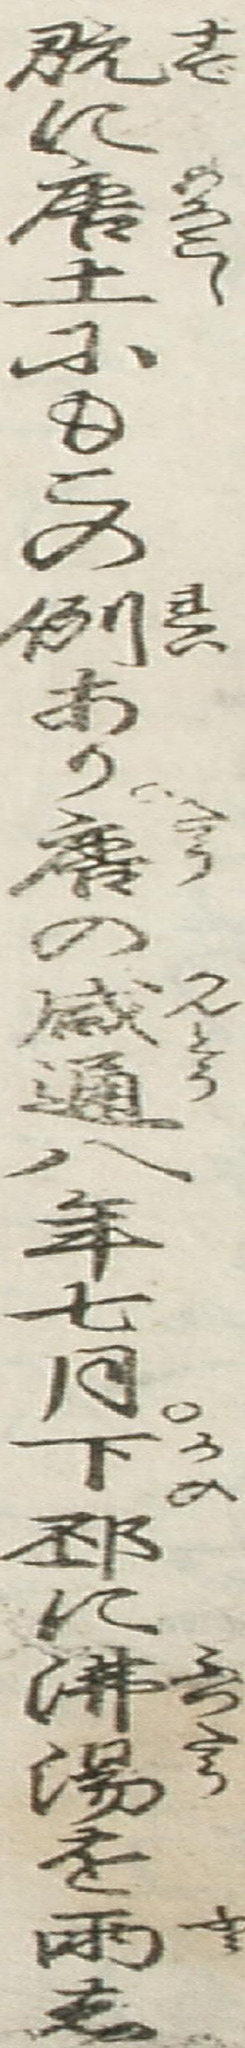既に唐土にもこの例あり。唐の咸通八年七月。下邳に沸湯を雨し
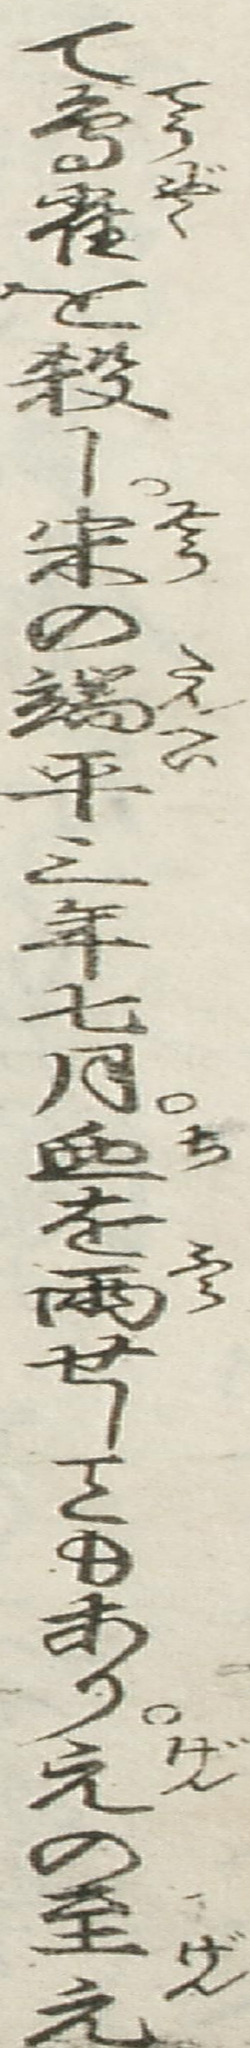て鳥雀を殺し。宋の端平三年七月。血を雨せしこともあり。元の至元
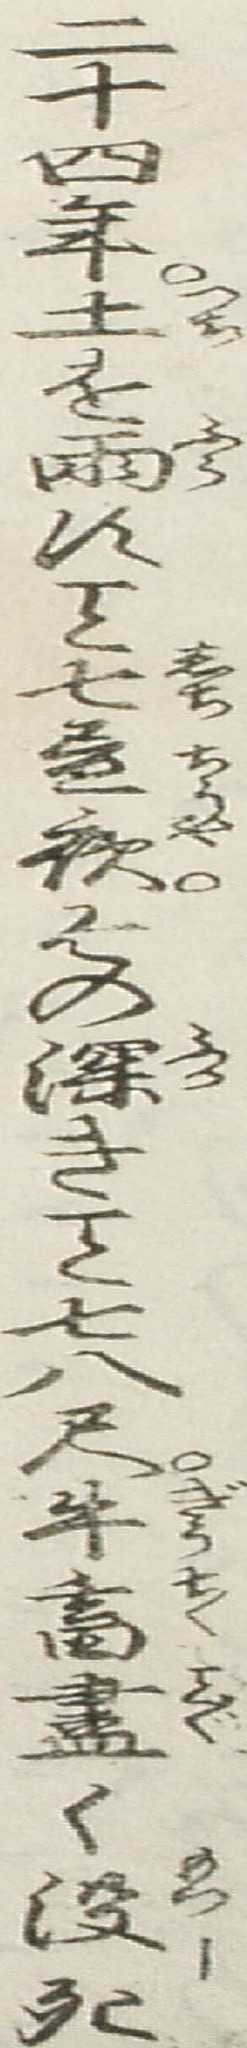二十四年。土を雨すこと七昼夜。その深きこと七八尺。牛畜盡く没死
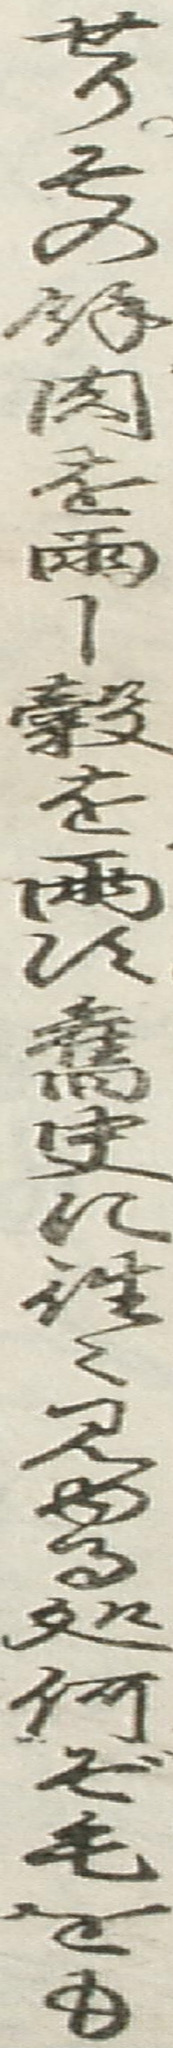せり。その餘肉を雨し穀を雨す。舊史に往々見ゆる処何ぞ毛をも
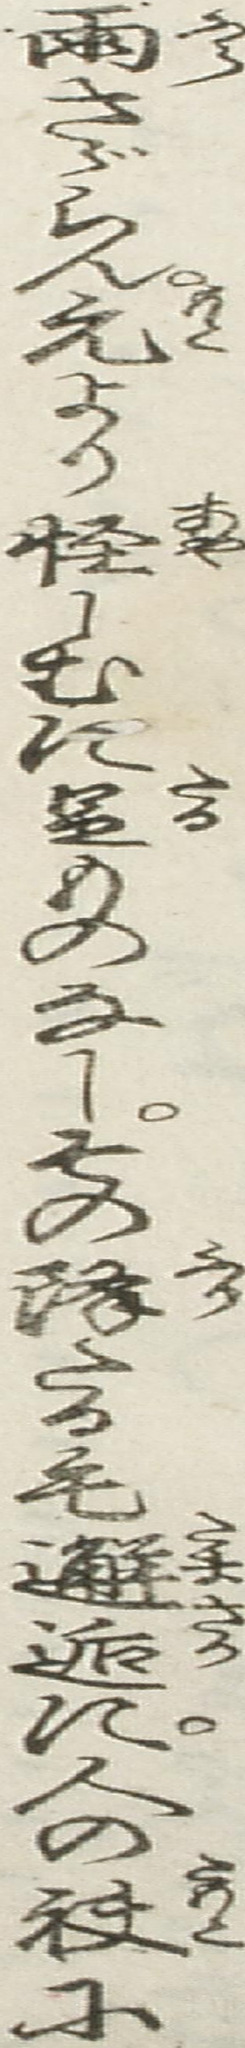雨さゞらん。元より怪しむに足ものなし。その降たる毛邂逅に。人の袂に
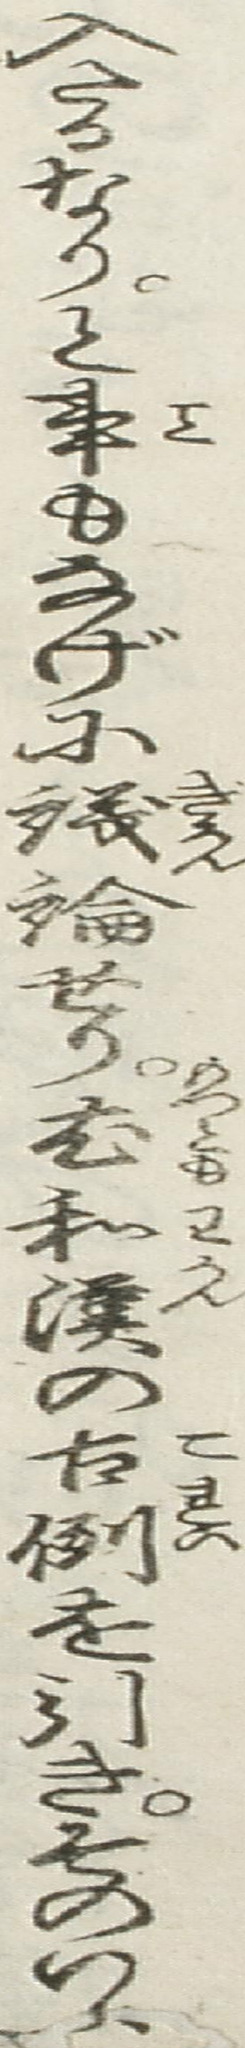入たるなり。と事もなげに議論せり。尤和漢の古例を引き。そのいふ
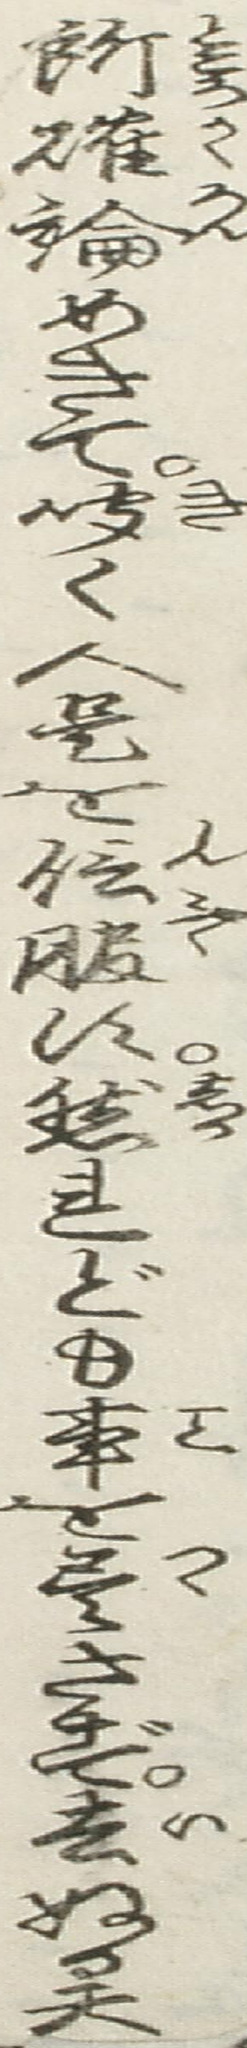所確論めきて。聞く人是を信服す。然れども事を尽さず。去ぬる天
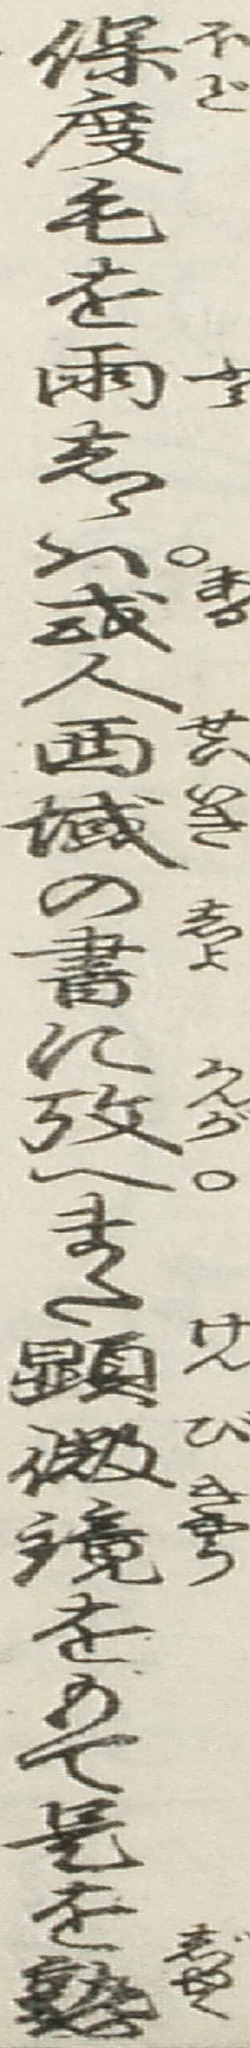保度毛を雨しゝは。或人西域の書に攷へ。また顕微鏡をもて是を熟
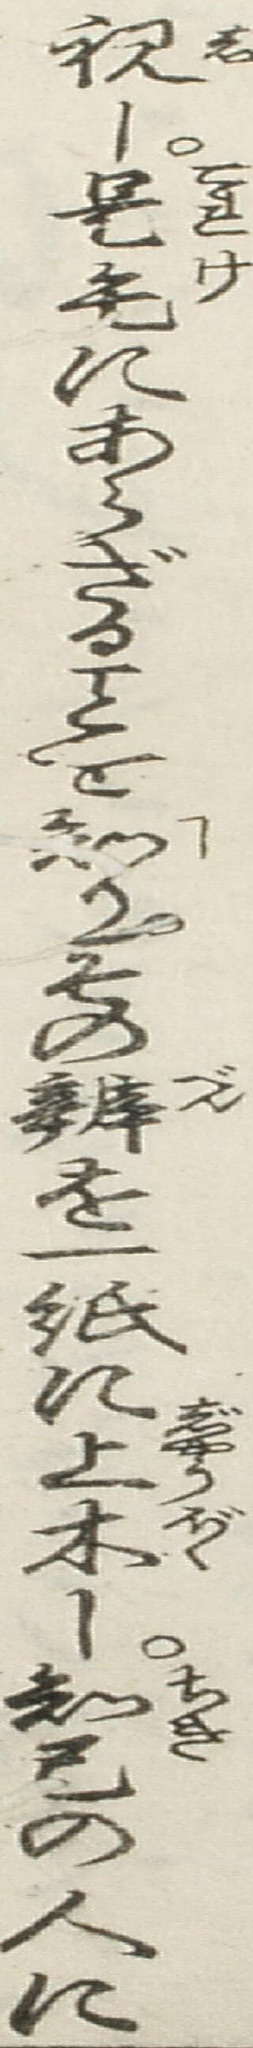視し。是毛にあらざることを知り。その辨を一紙に上木し。知己の人に
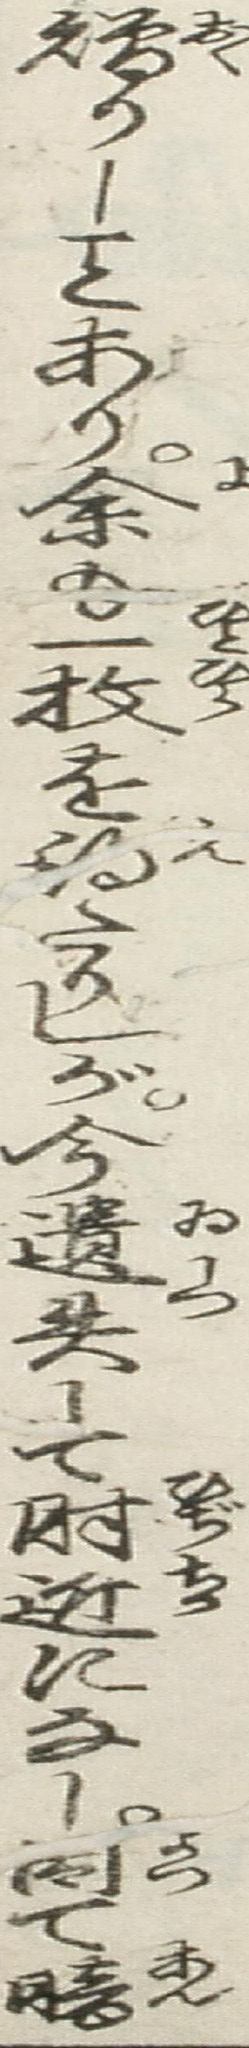贈りしことあり。余も一枚を得たりしが。今遺失して肘近になし。因て暗
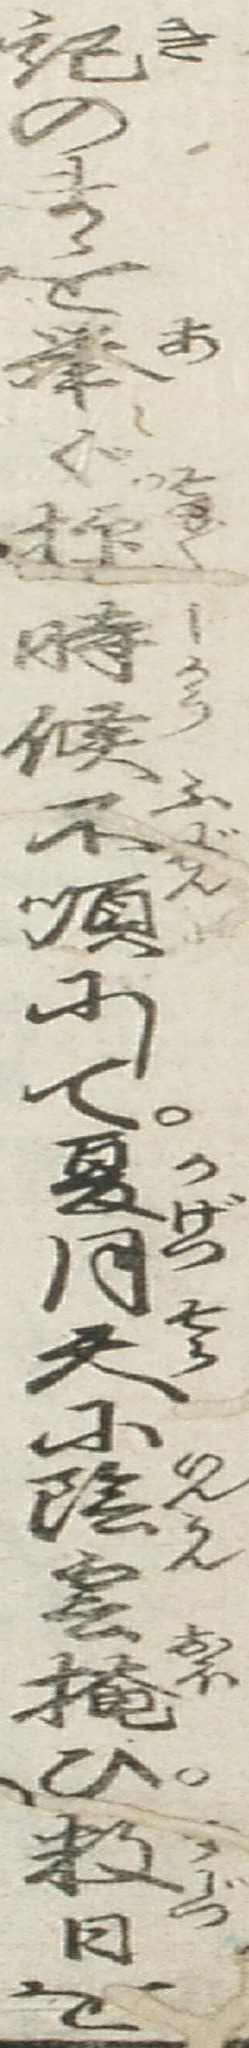記のまゝを挙ぐ。抑時候不順にして。夏月天に陰雲掩ひ。数日を
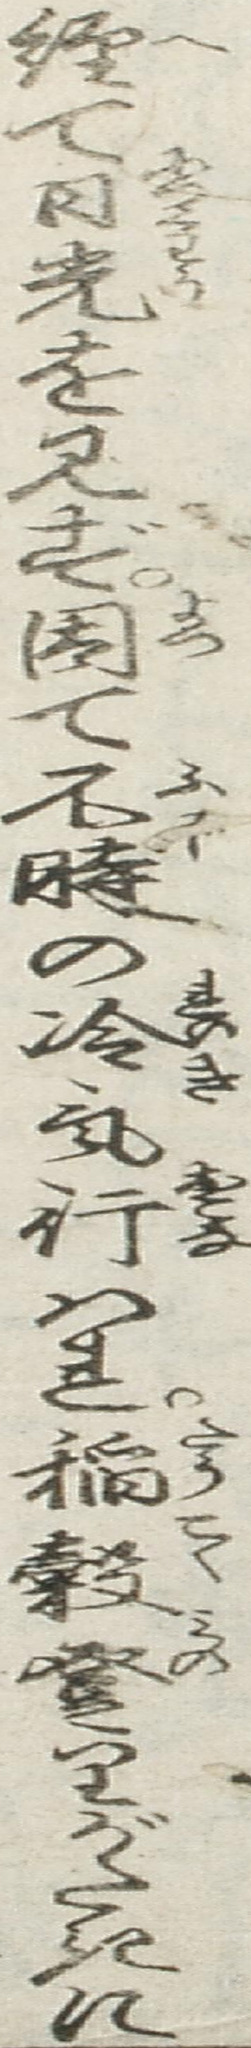経て日光を見ず。因て不時の冷気行はれ。稲穀登りがたきに
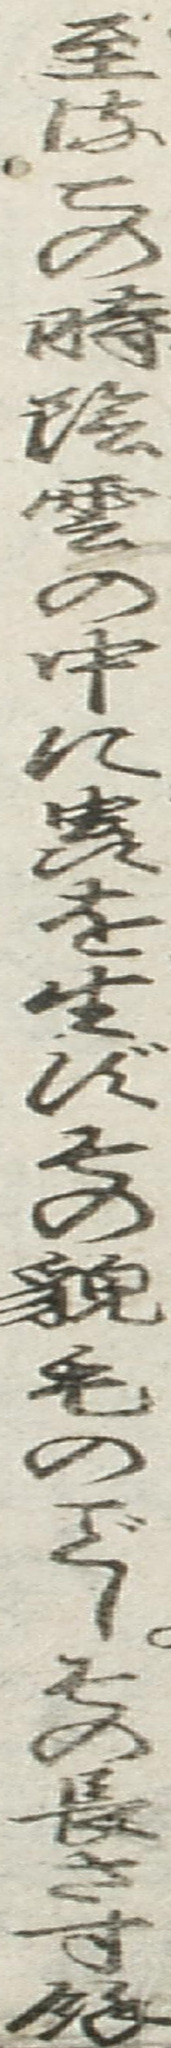至る。この時陰雲の中に蟲を生ず。その貌毛のごとし。その長さ寸餘
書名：安政見聞録　下
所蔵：東京大学地震研究所図書室 Earthquake Research Institute Library, The University of Tokyo, JAPAN
